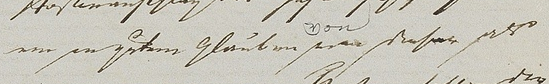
ein in gutem Glauben von dieser als
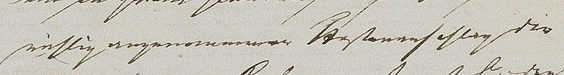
richtig angenommener Kostenanschlag der
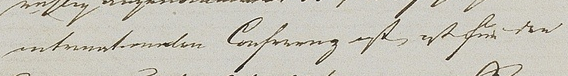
internationalen Conferenz ist ist für die
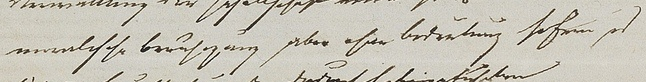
moralische Beruhigung aber ohne Bedeutung sofern es
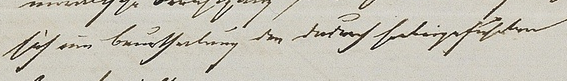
sich um Beurtheilung der dadurch herbeigeführten
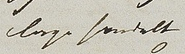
Lage handelt.
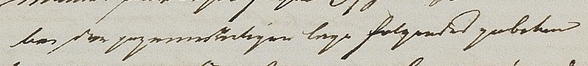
bei der gegenwärtigen Lage folgendes geboten
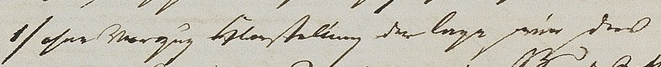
1) ohne Verzug Klarstellung der Lage wie dies
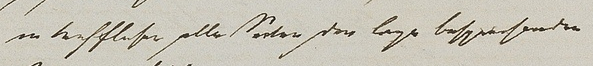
in trefflicher alle Seiten der Lage besprechender
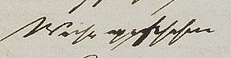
Weise geschehen.
